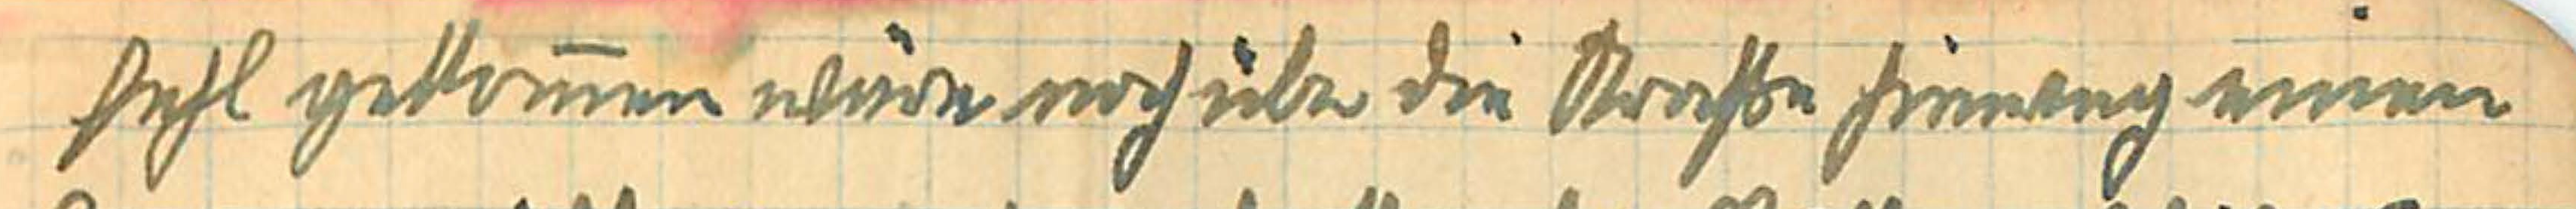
fehl gekommen wäre noch über die Straße hinweg einen
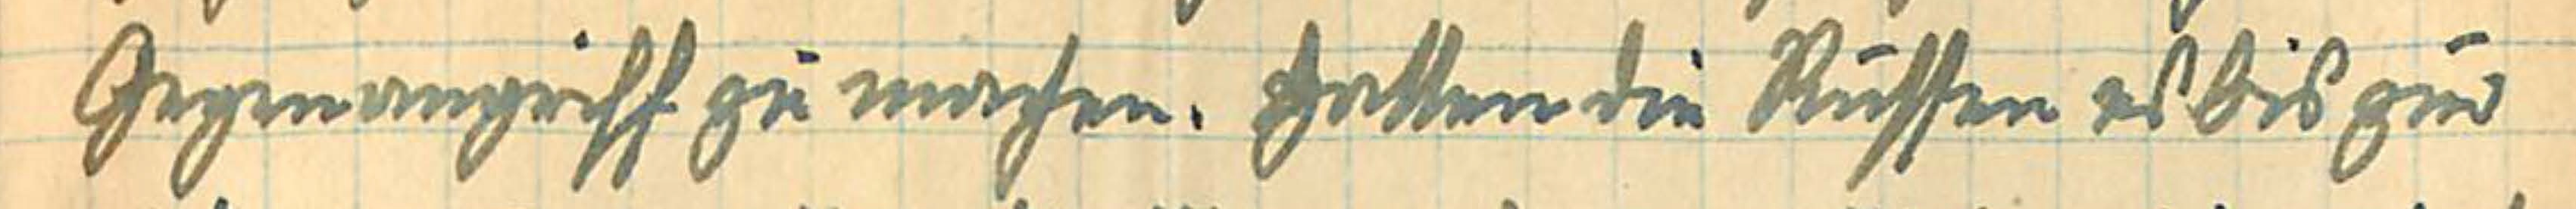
Gegenangriff zu machen. Hatten die Russen es bis zur
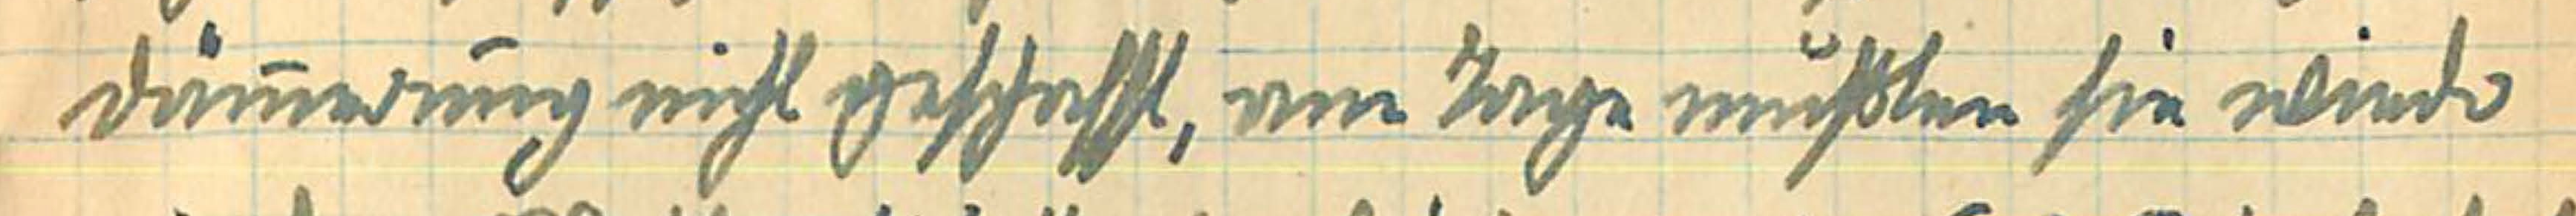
Dämmerung nicht geschafft, am Tage mußten sie wieder
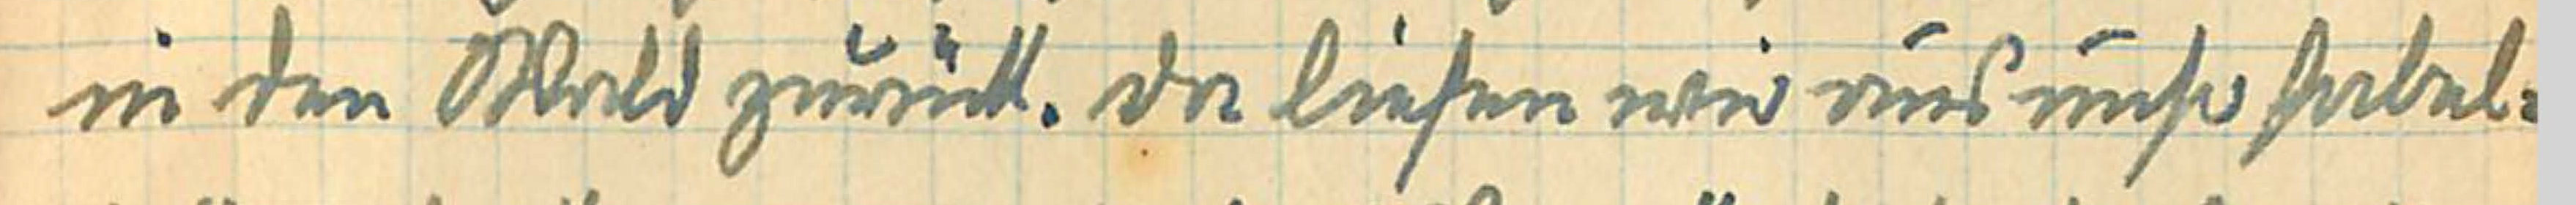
in den Wald zurück. Da liefen wir aus unser fabel-
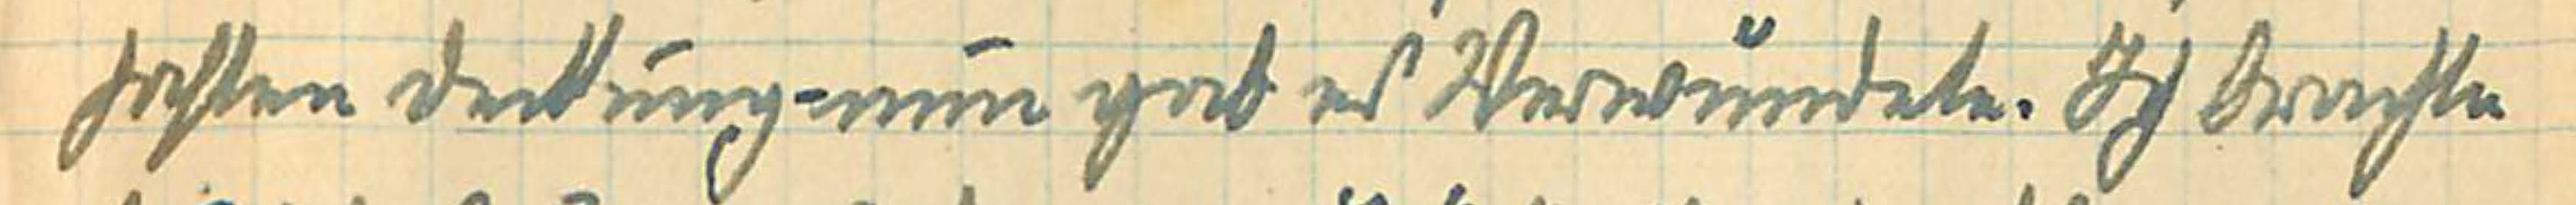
haften Deckung – nun gab es Verwundete. Ich brachte
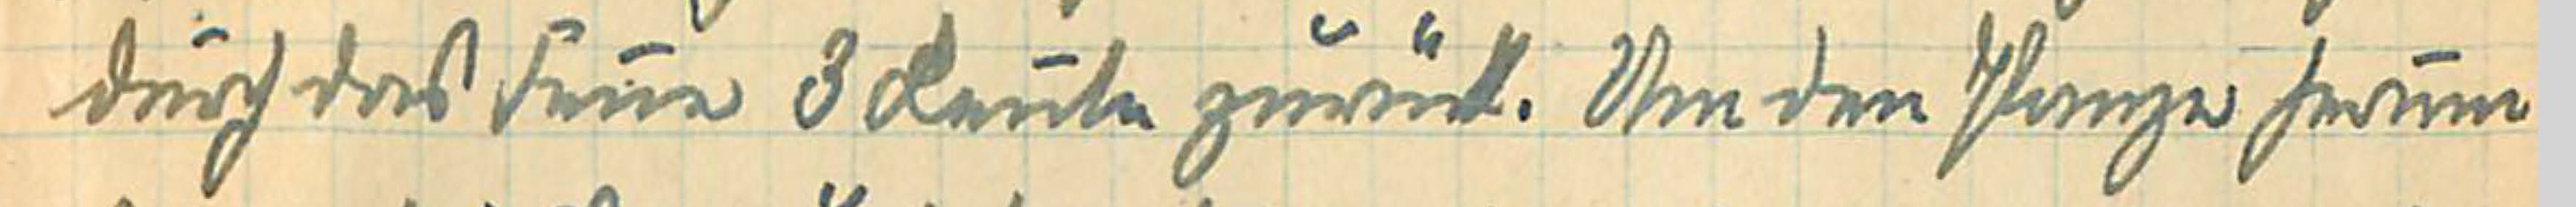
durch das Feuer 3 Leute zurück. Um den Panzer herum
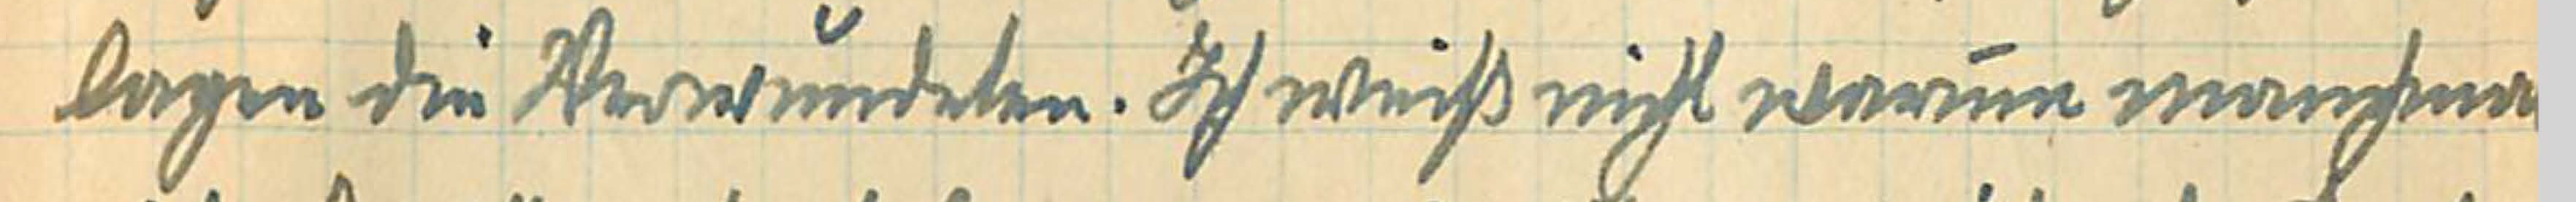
lagen die Verwundeten. Ich weiß nicht warum manchmal
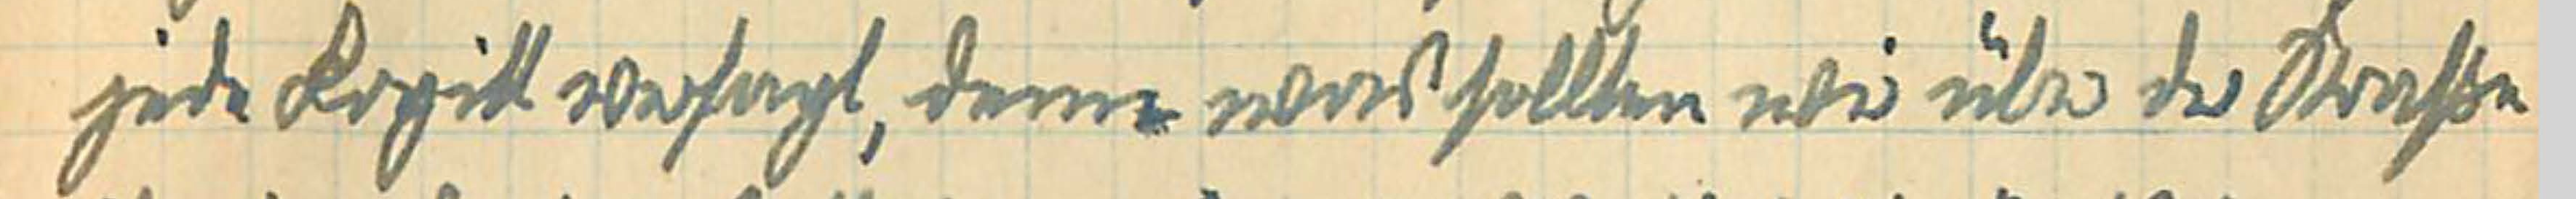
jede Logik versagt, denn was sollten wir über der Straße.
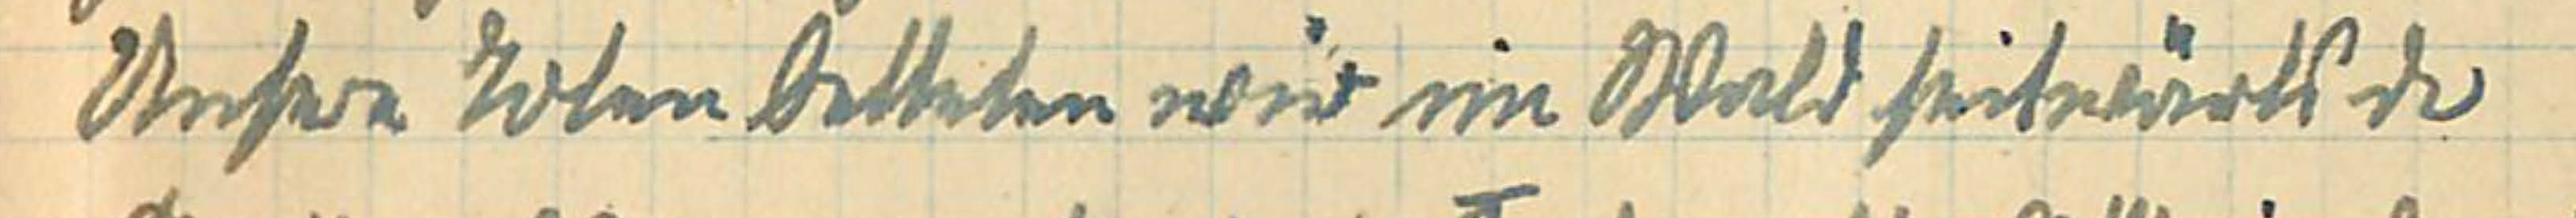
Unsere Toten betteten wir im Wald seitwärts der
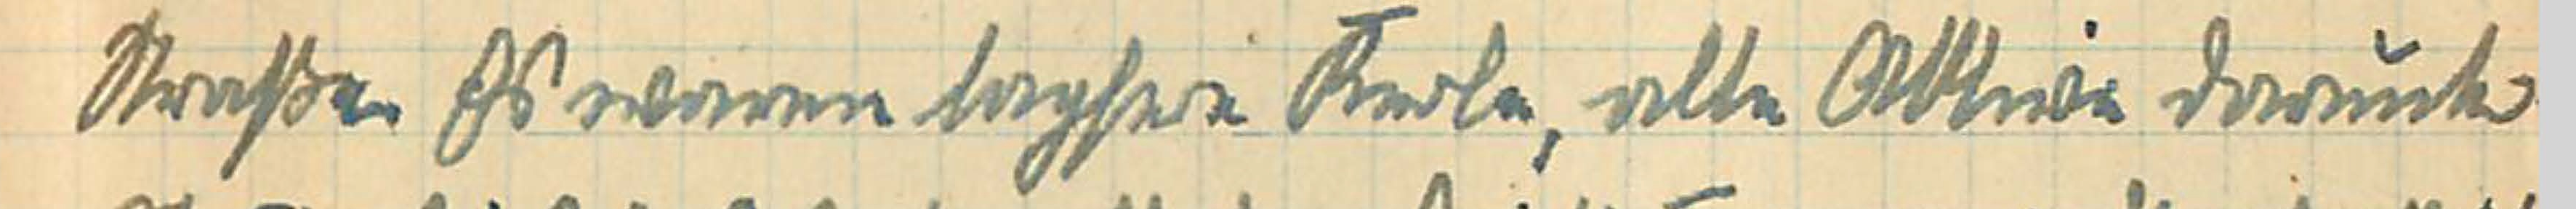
Muß dies das Ende all der Leistungen u. Tapferkeit
